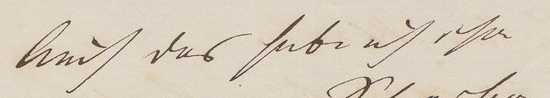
Auch das habe ich ihm schon
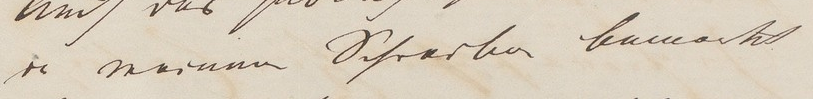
in meinem Schreiben bemerkt.
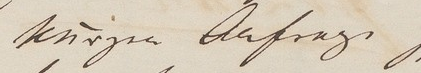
kurzen Anfrage
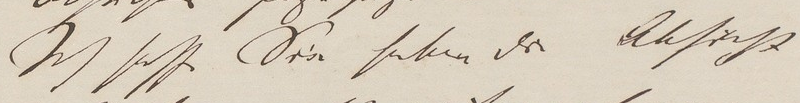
Ich hoffe Sie haben die Absicht
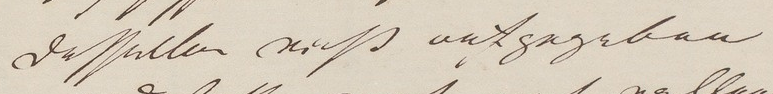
desselben nicht aufgegeben
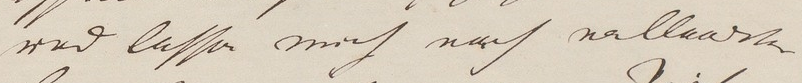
und lassen mich nach vollendeter
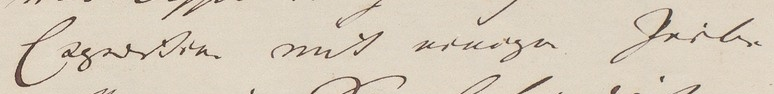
Expedition mit einigen Zeilen
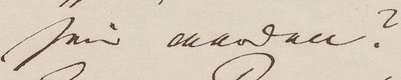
sein werden?
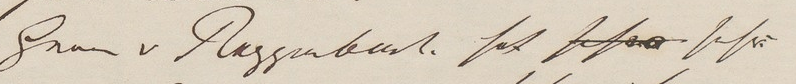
Herr v Roggenbach hat sicher sehr
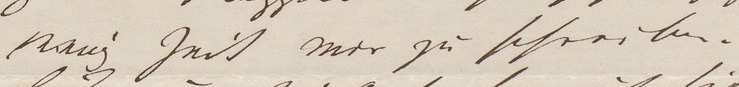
wenig Zeit mir zu schreiben.
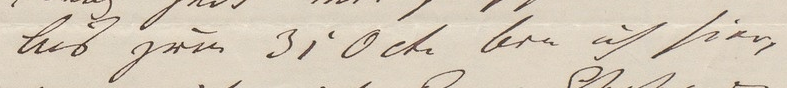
Bis zum 31 Oct. bin ich hier,
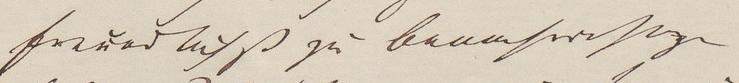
freundlichst zu benachrichtigen
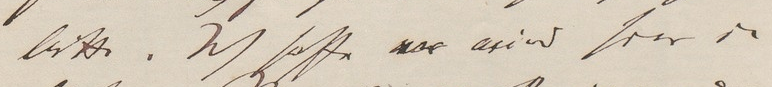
bitte. Ich hoffe er wird hier in
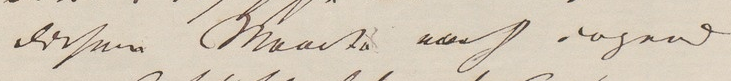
diesem Monate noch irgend
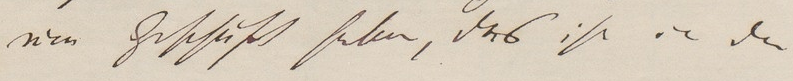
ein Geschäft haben, das ihn in den
